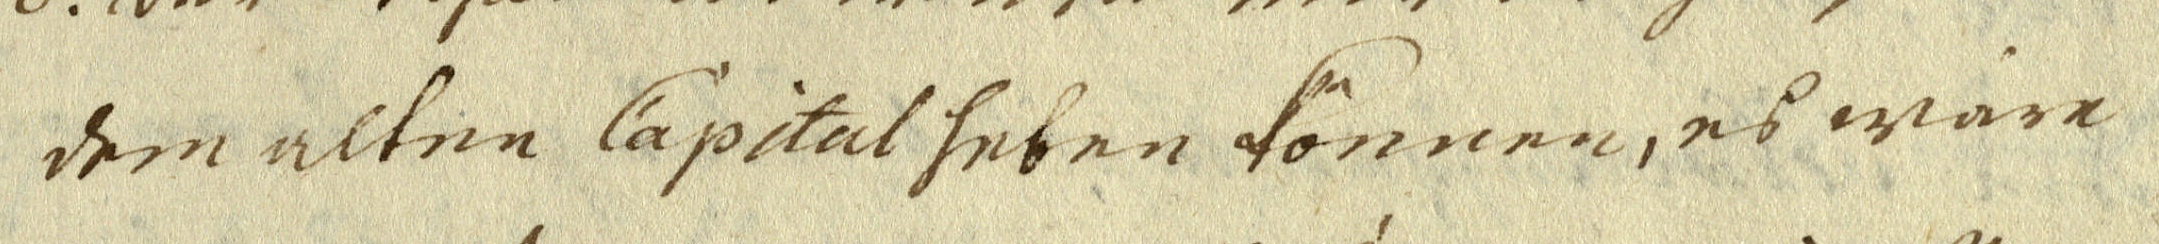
dem alten Capital heben können, es wäre
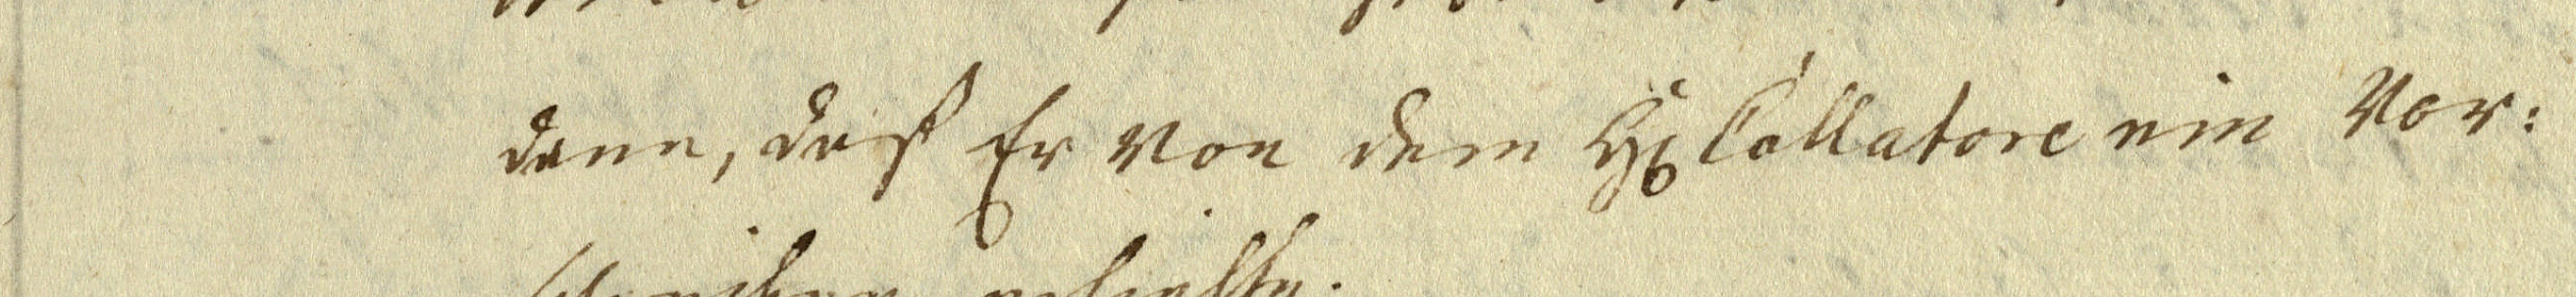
denn, daß Er von dem H Collatore ein Vor¬
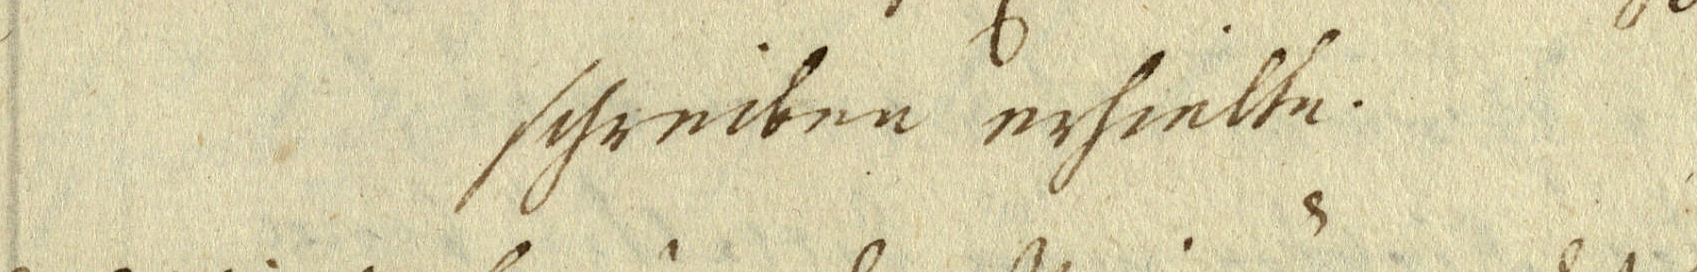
schreiben erhielte.
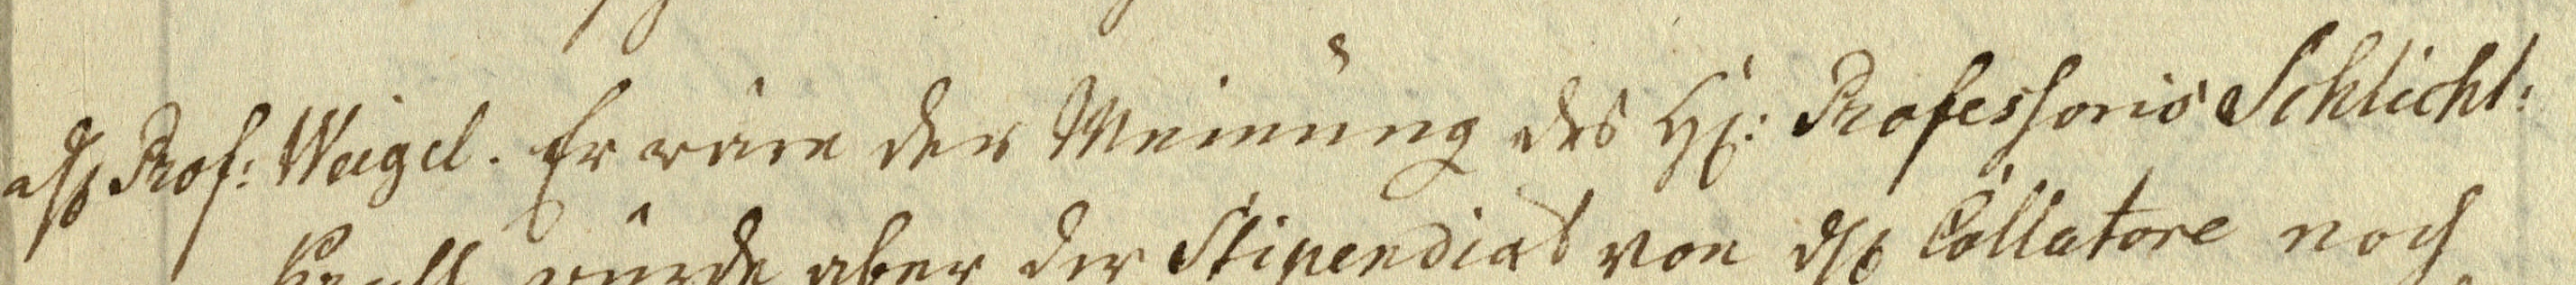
dh Prof: Weigel. Er wäre der Meinung des H Professoris Schlicht¬
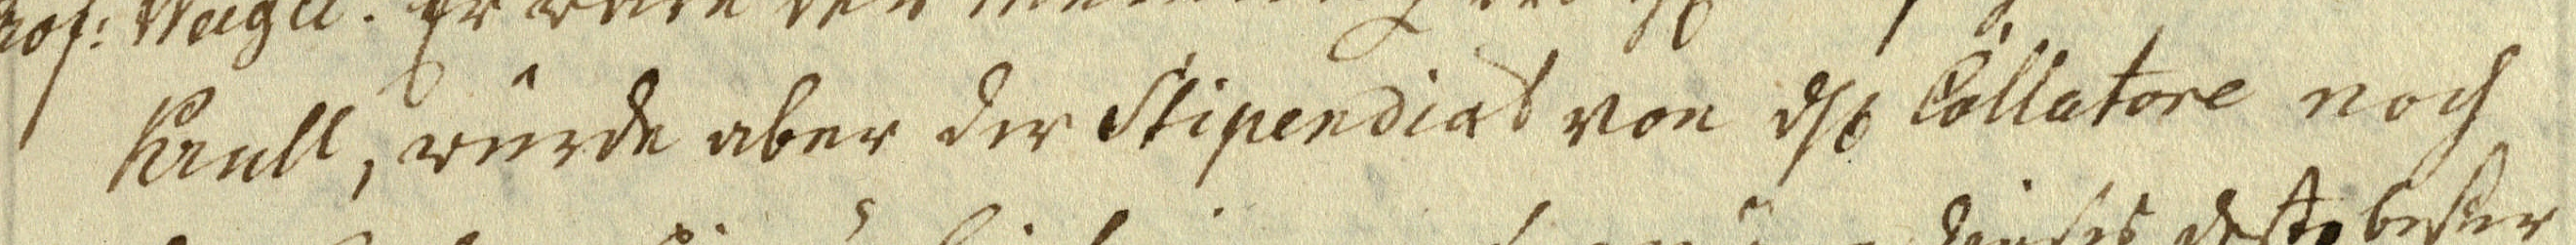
krull, würde aber der Stipendiat von dh Collatore noch
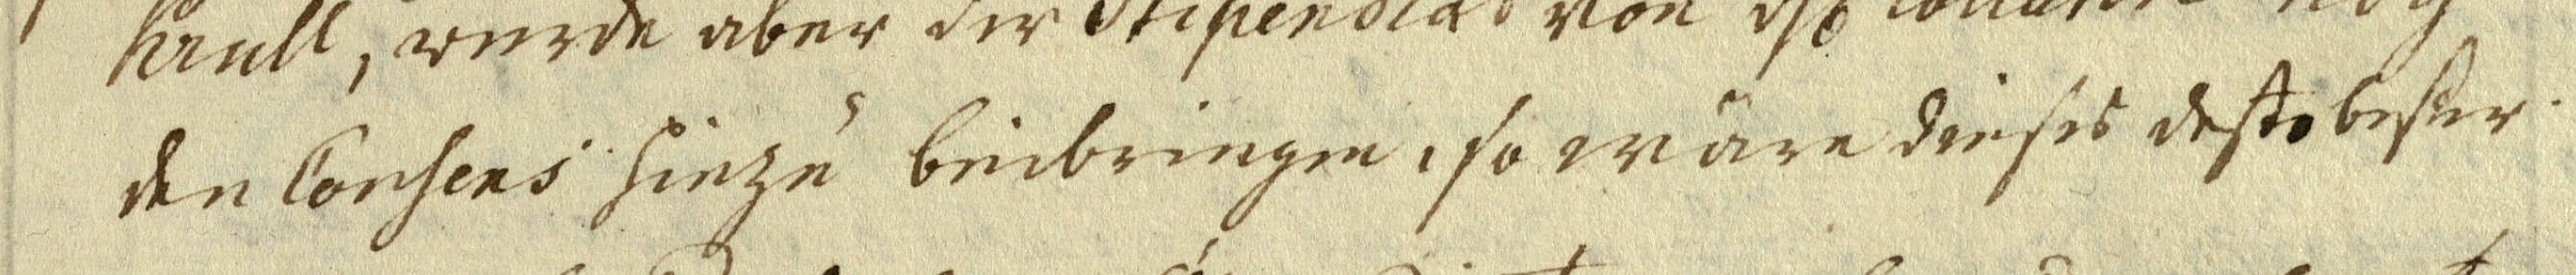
den Consens hiezu beibringen, so wäre dieses desto beßer.
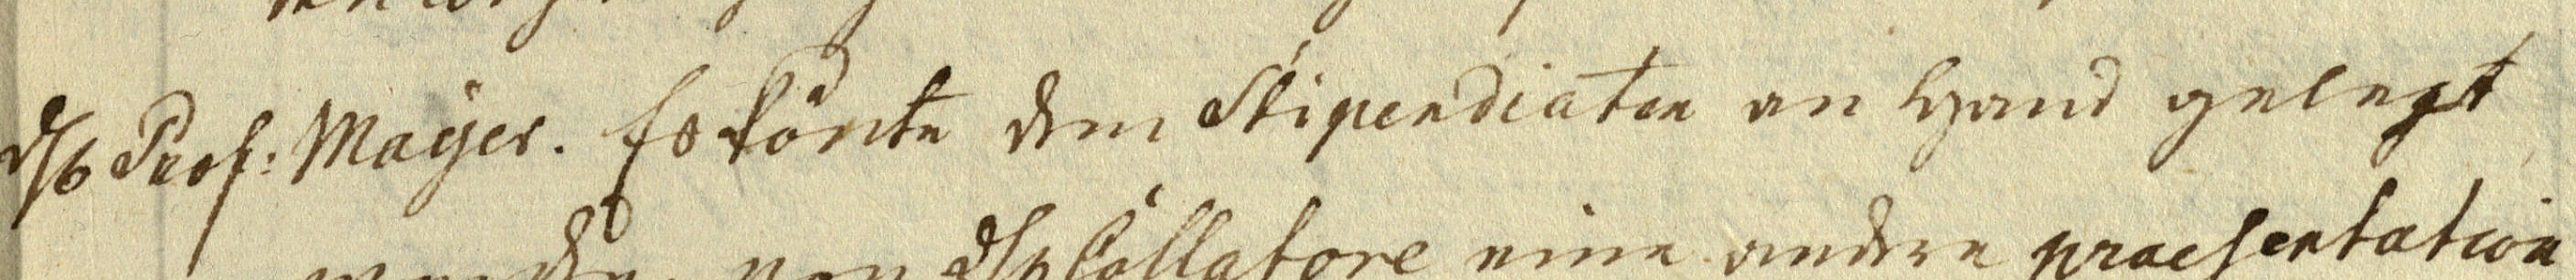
dh Prof: Maÿer. Es könte dem Stipendiaten an Hand gelegt
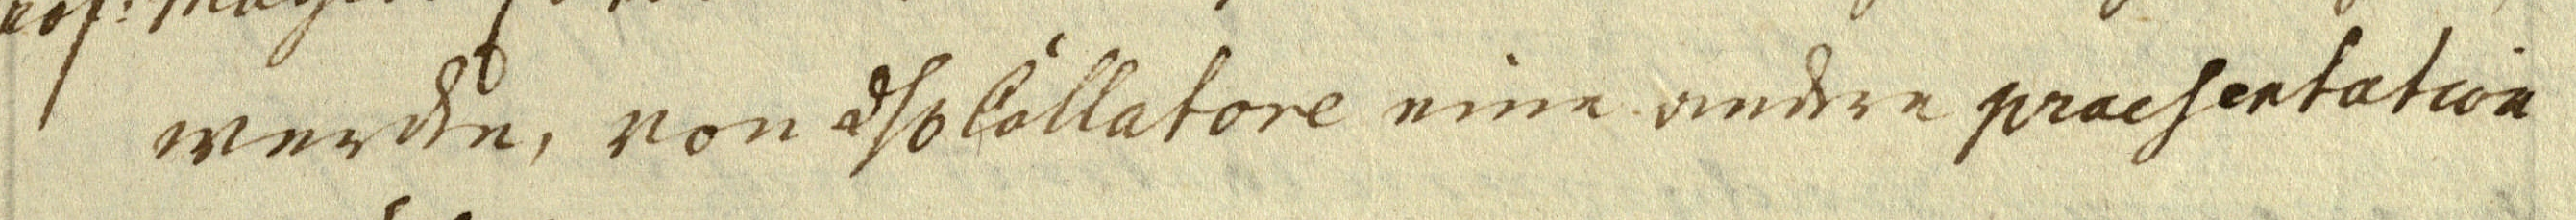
werden, von dh Collatore eine andere praesentation
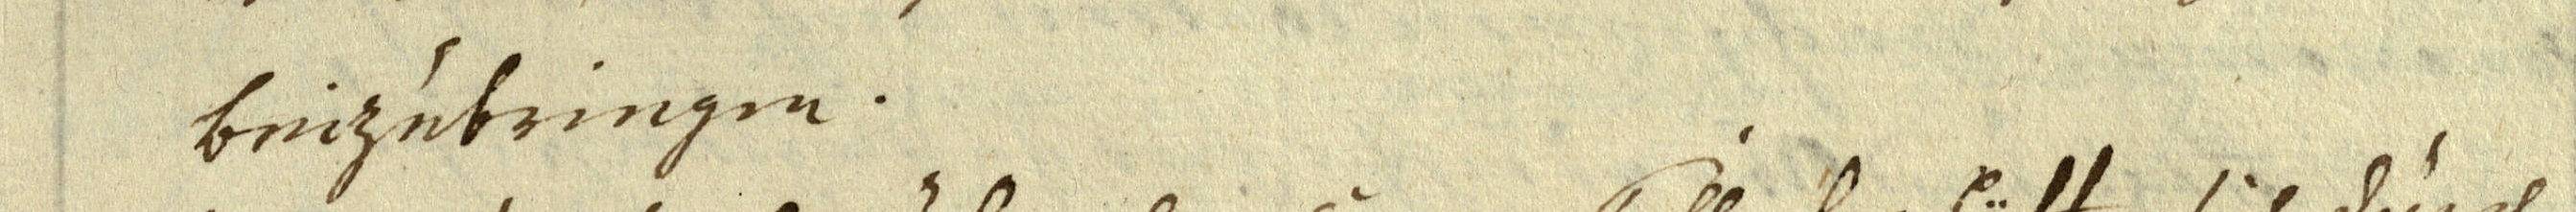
beizubringen.
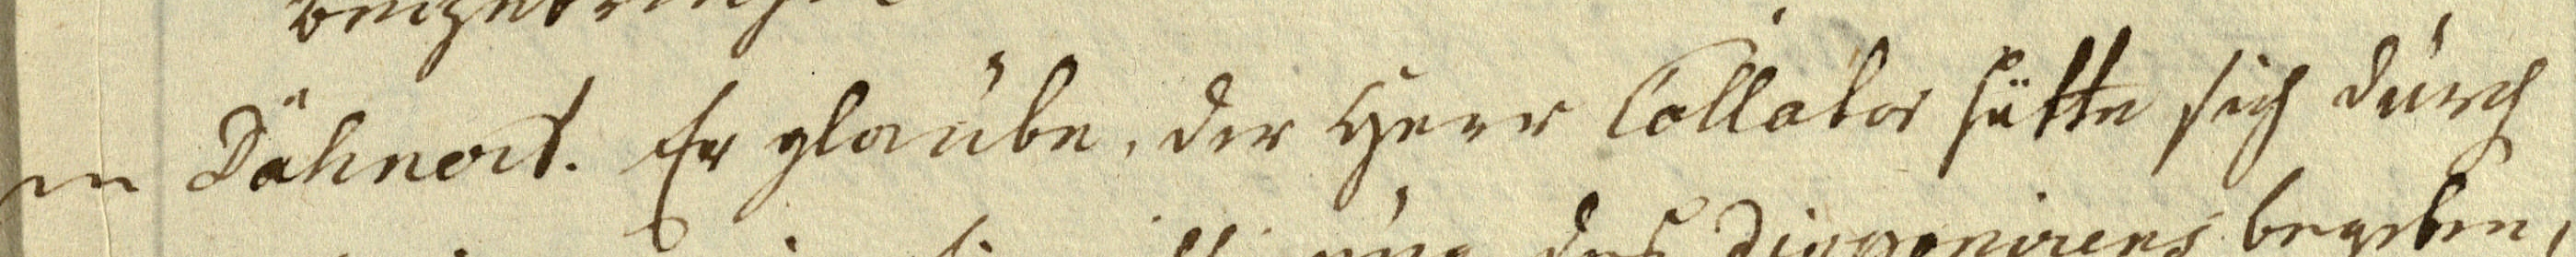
Dähnert. Er glaube, der Herr Collator hätte sich durch
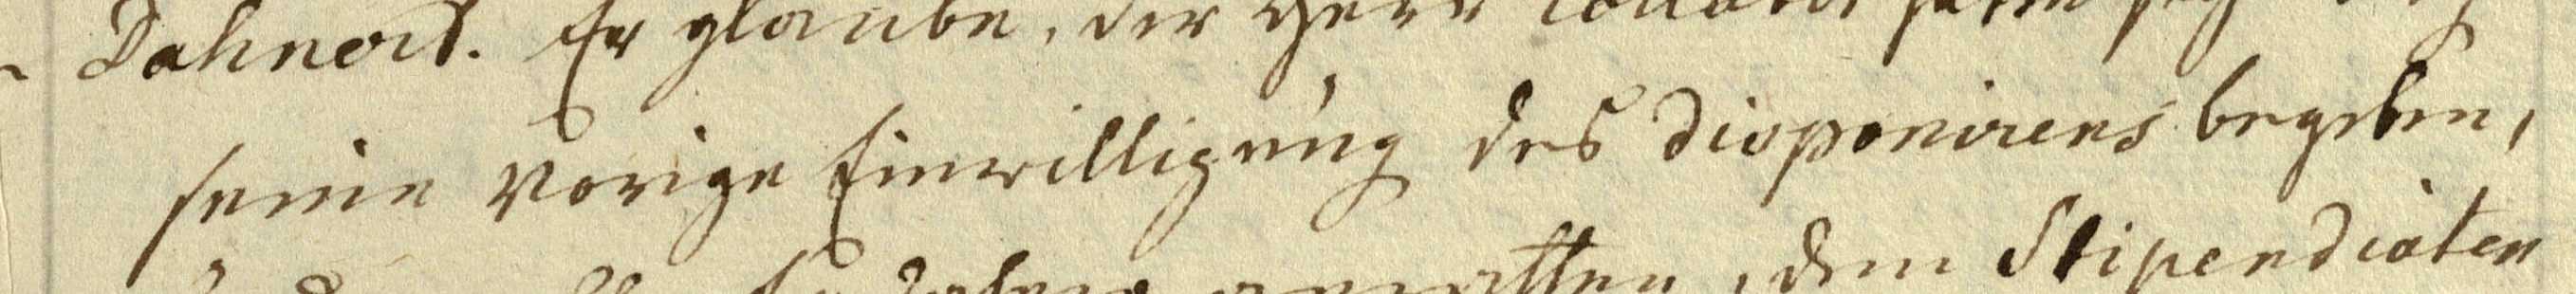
seine vorige Einwilligung des disponirens begeben,
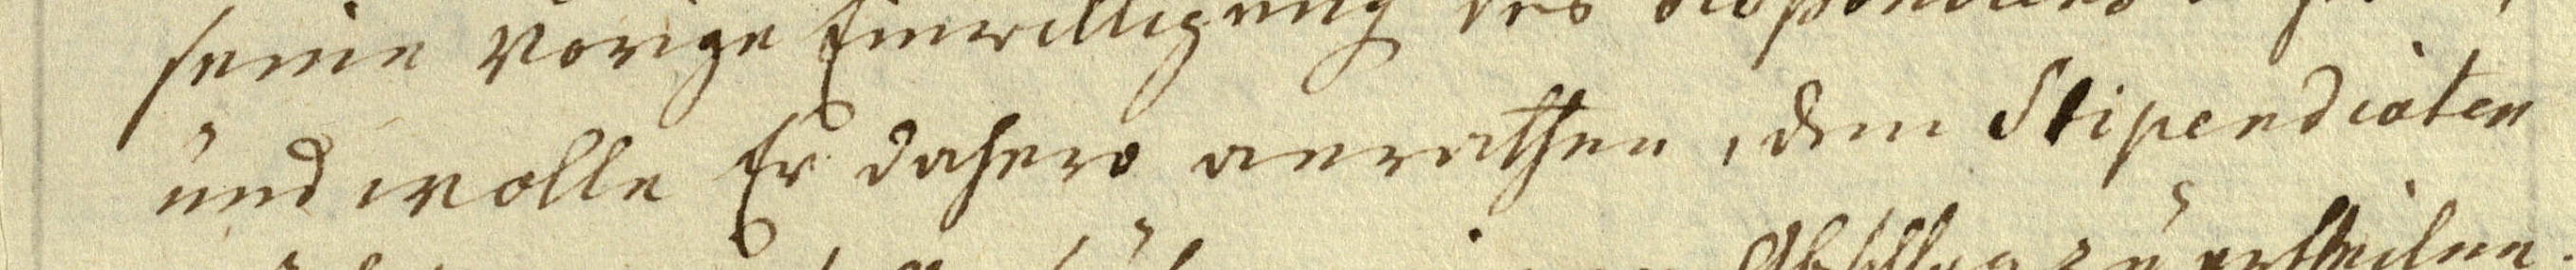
und wolle Er daher anrathen, dem Stipendiaten
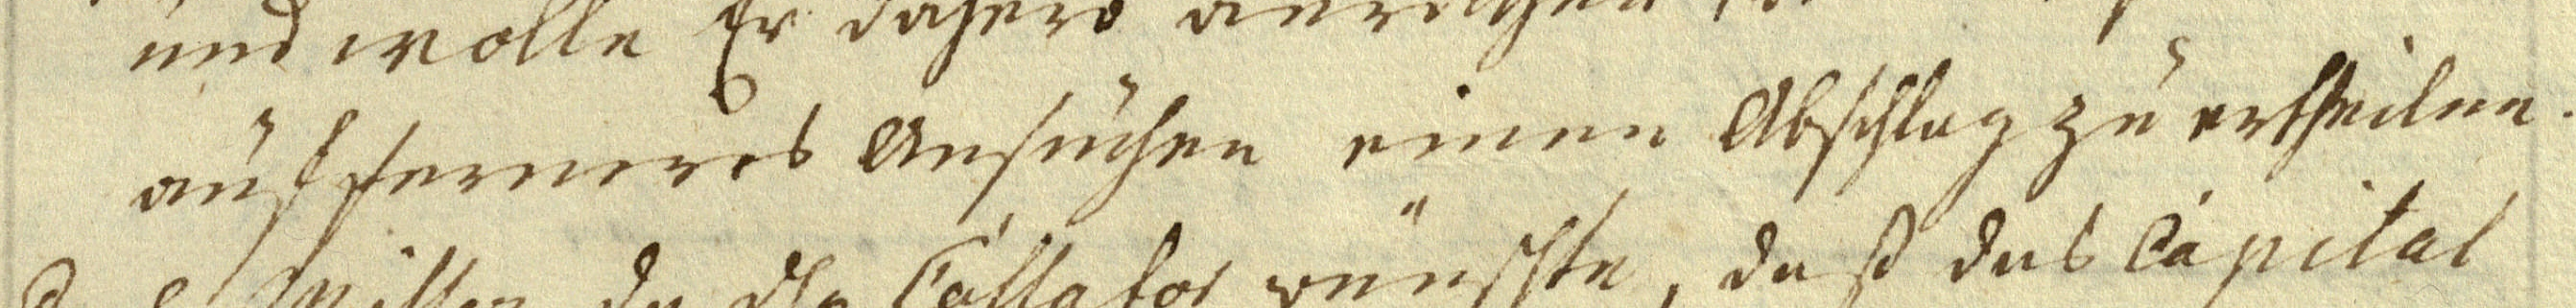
auf ferneres Ansuchen einen Abschlag zu ertheilen.
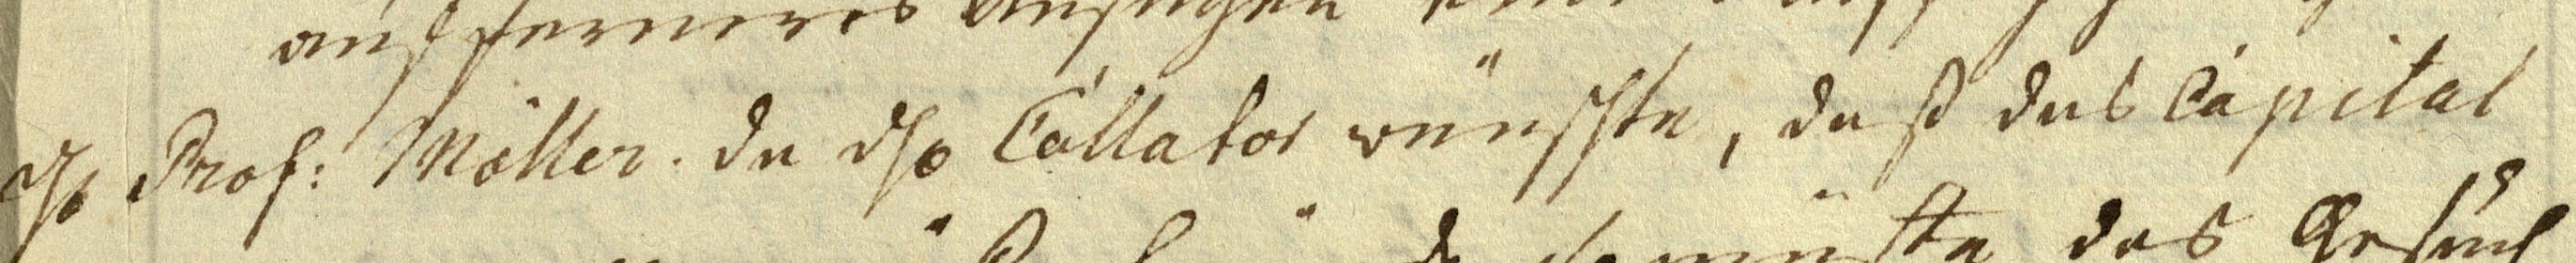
dh Prof: Möller. da dh Collator wünschte, daß das Capital
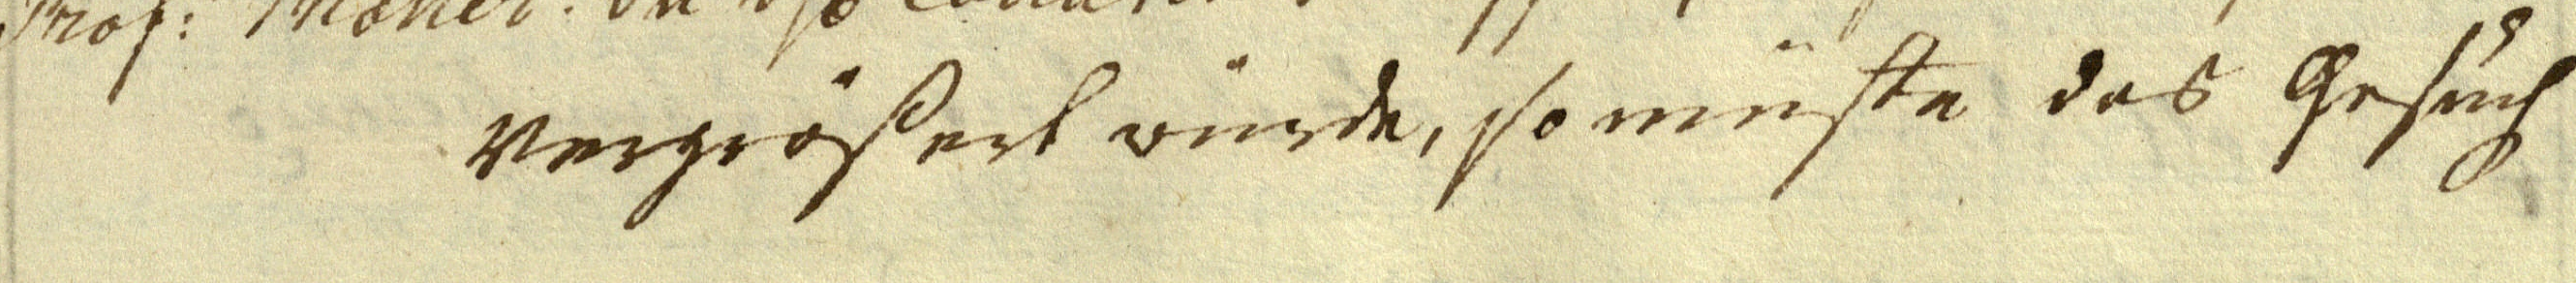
vergrößert würde, so müßte das Gesuch
